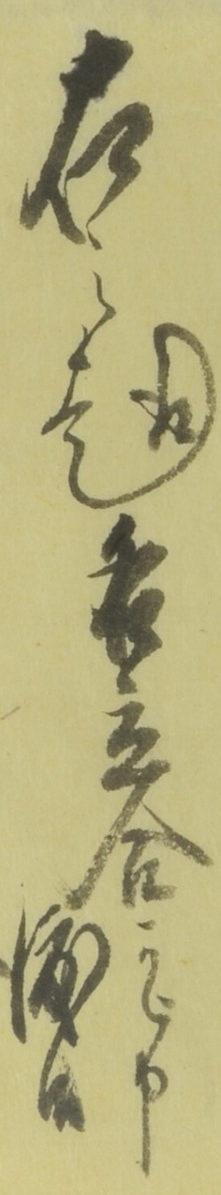右之趣各立合可被申

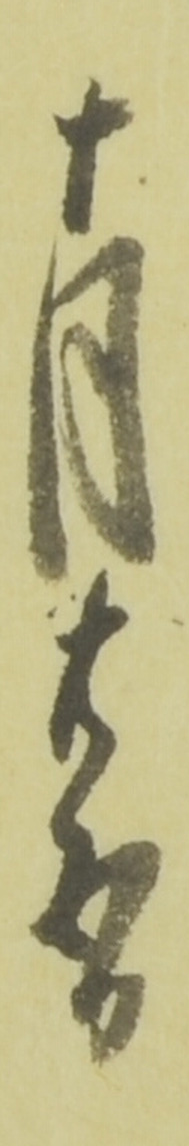十月廿五日
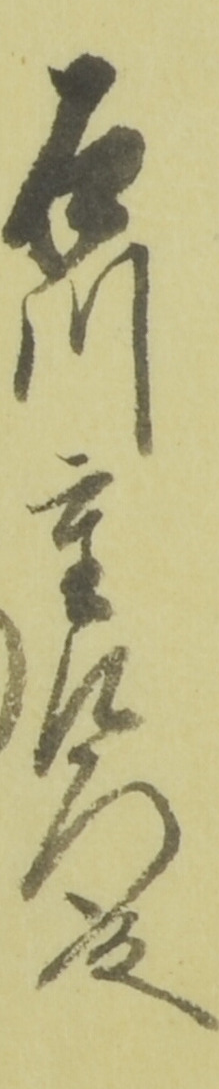石川重左衛門殿
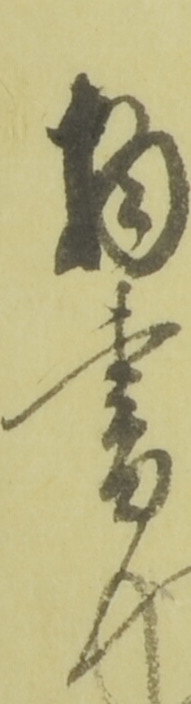物書中
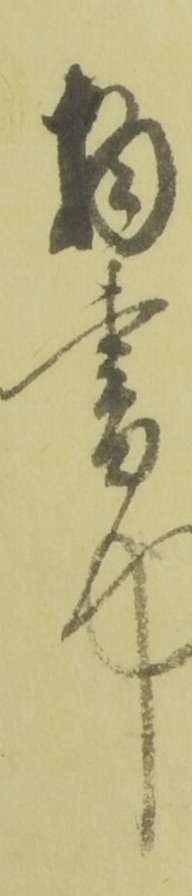物書中
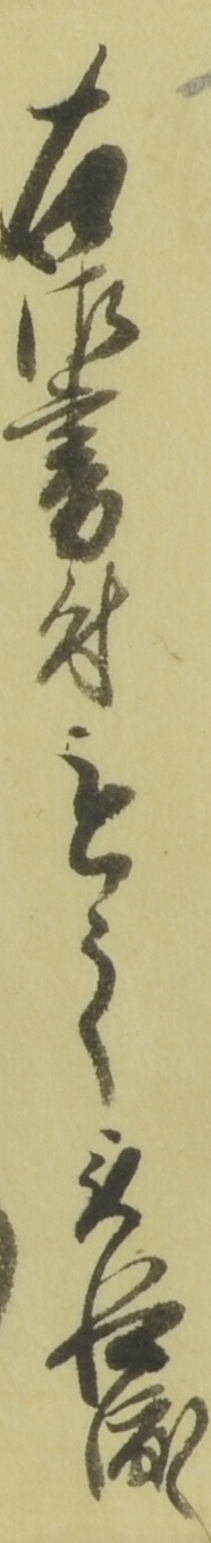右御書付もし被仰渡候
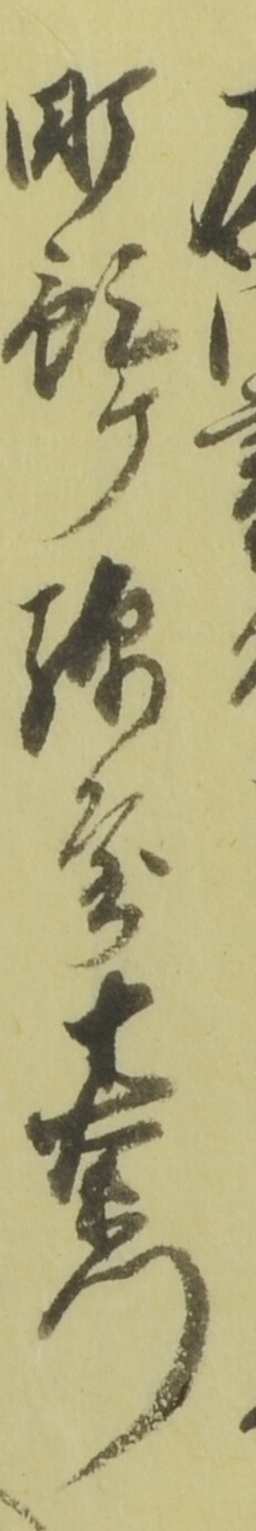町預ヶ綿屋十右衛門
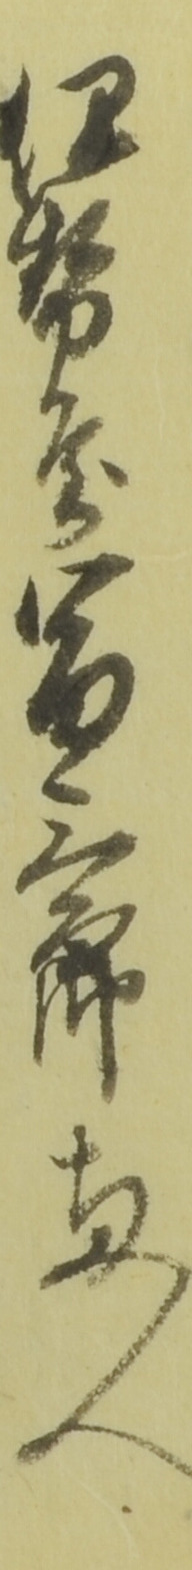伊勢屋富三郎両人
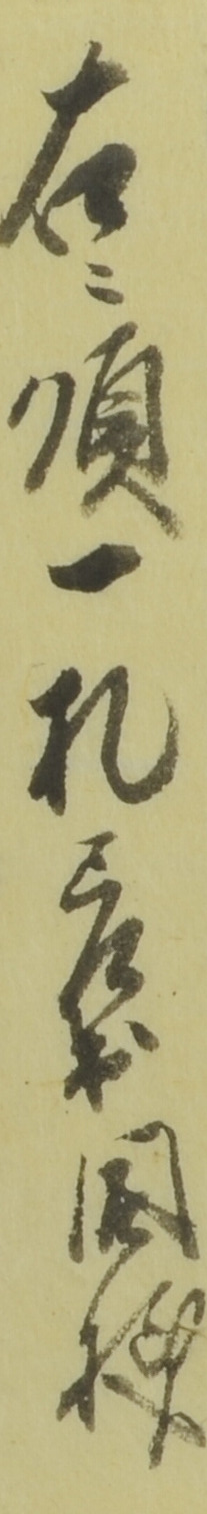右ニ順一札差出同様
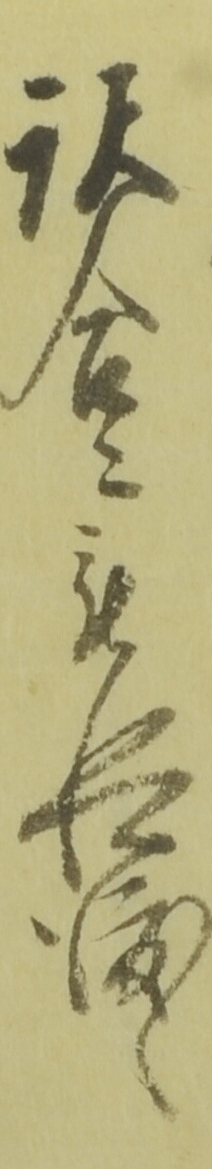訳合ニ被仰渡候
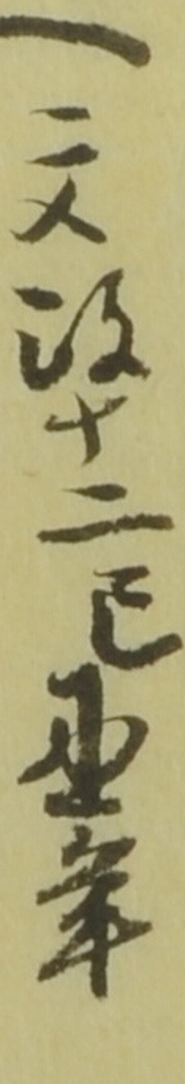文政十二己丑年
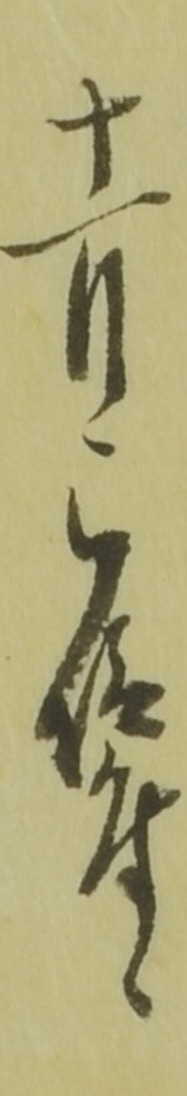十一月被仰付候
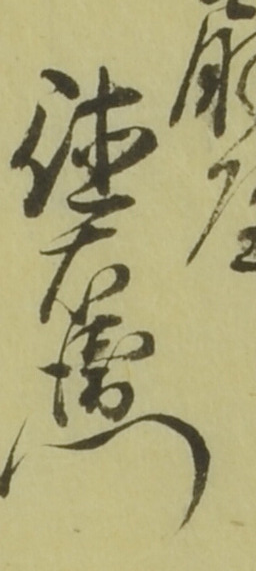徳右衛門
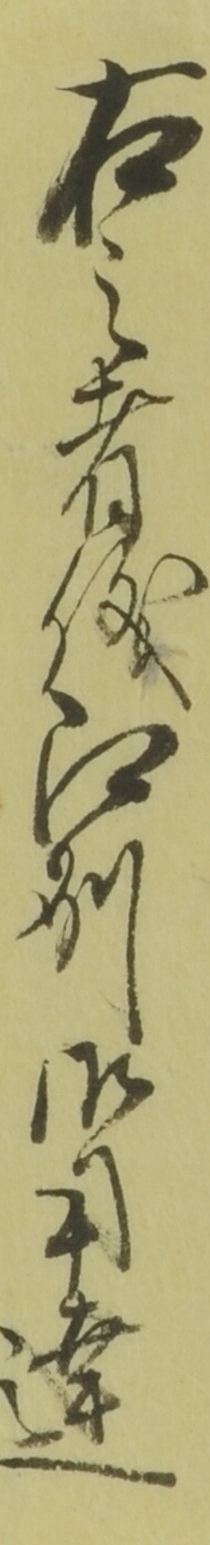右之者儀江州御用達
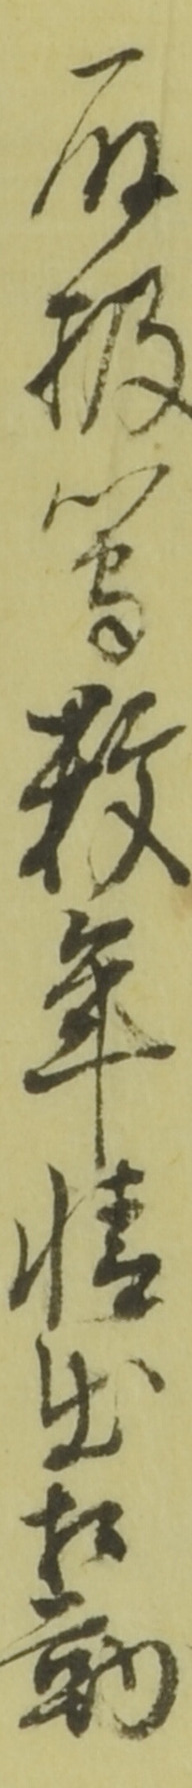取扱等数年精出相勤
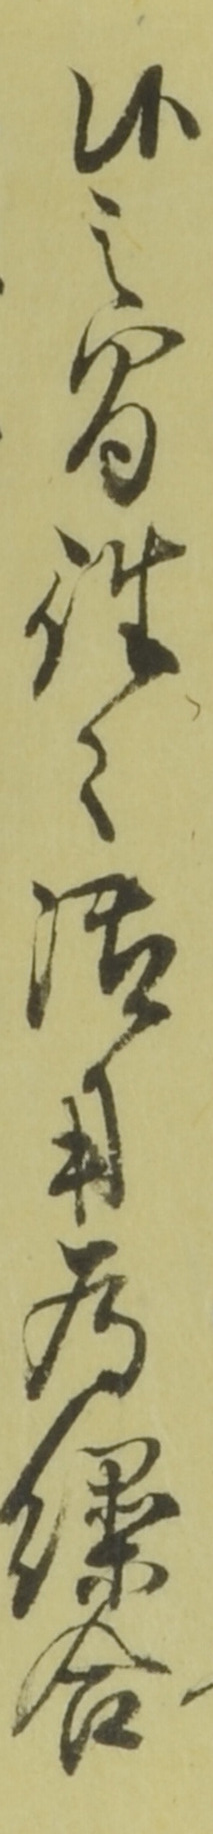候之間往々御用為繰合
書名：御触書御書附控
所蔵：伊那市立高遠町図書館・合同会社AMANE
